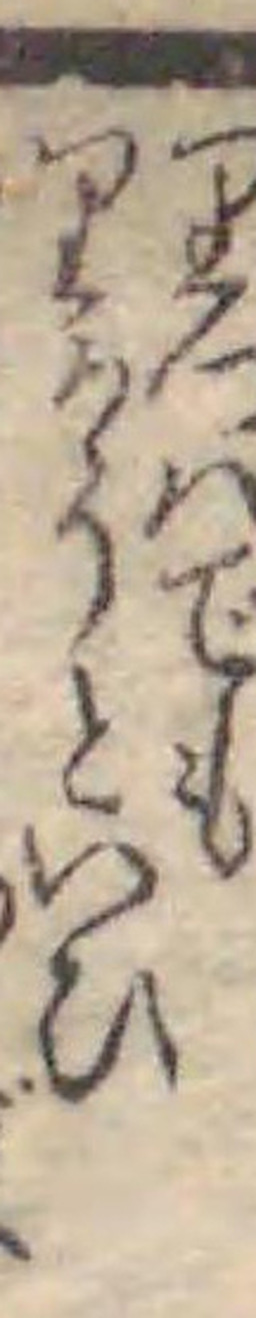りかうといひ
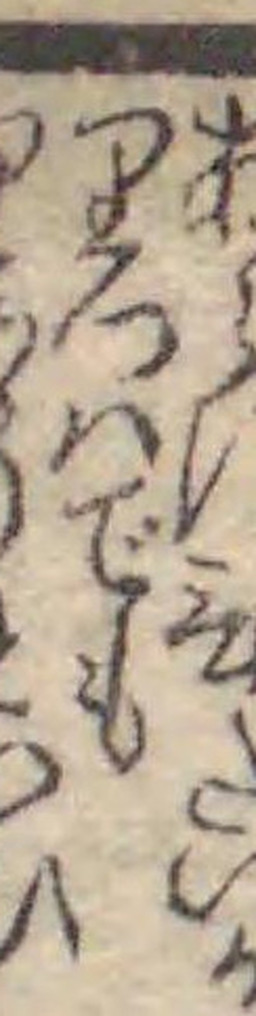りつはでも
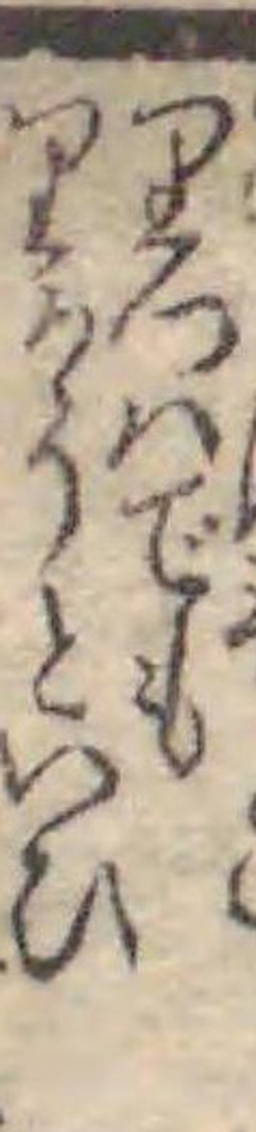りかうといひ
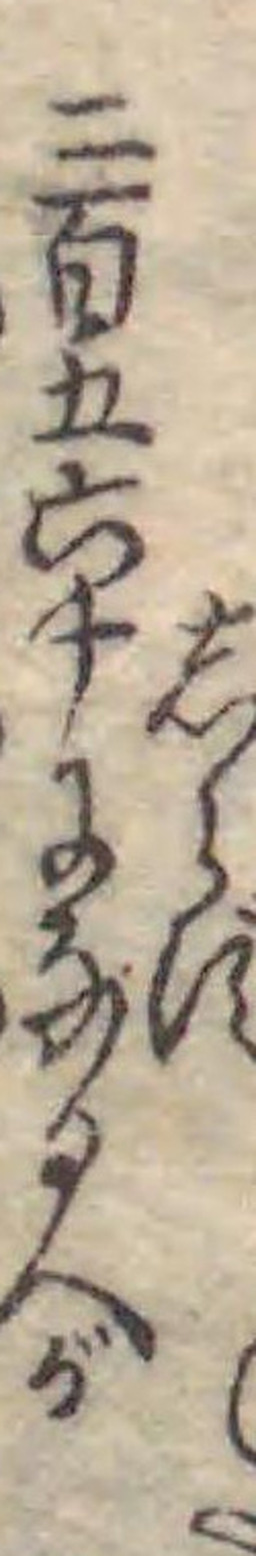二百五六十になる人が
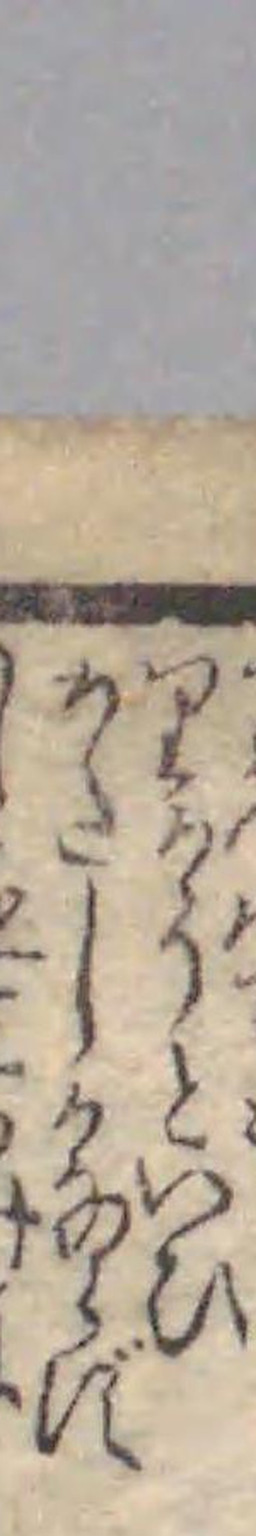かたしかならず
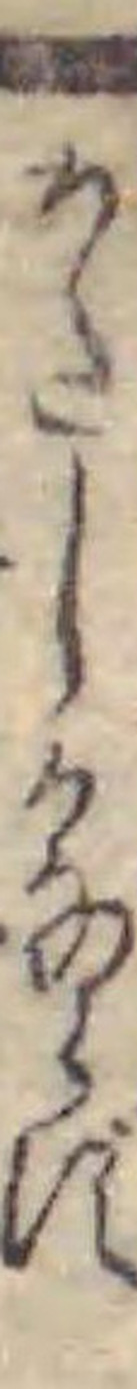かたしかならず
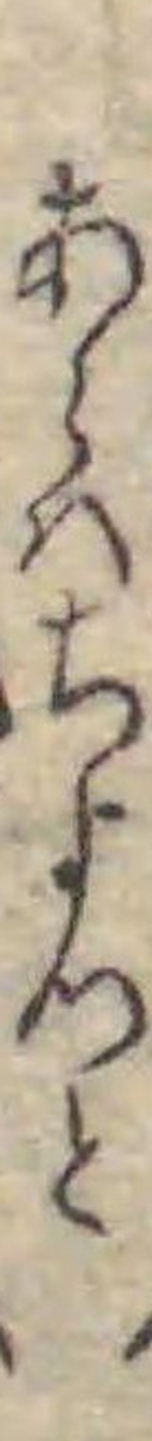あらはしよつと
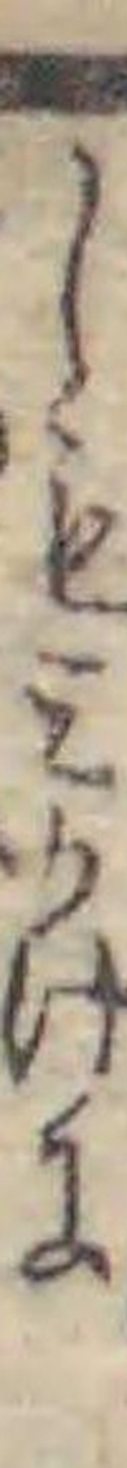しもみかけに
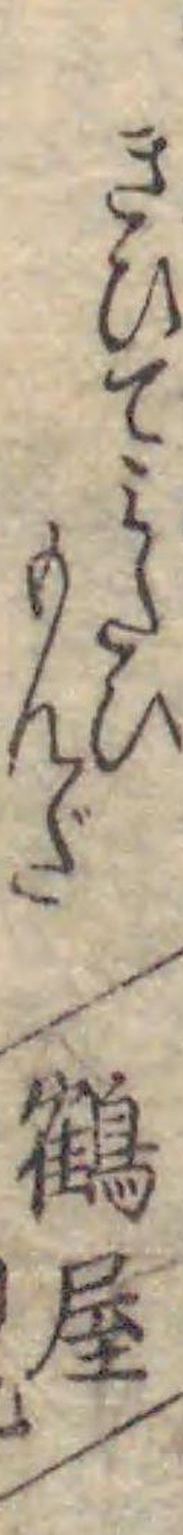きひてみたひ
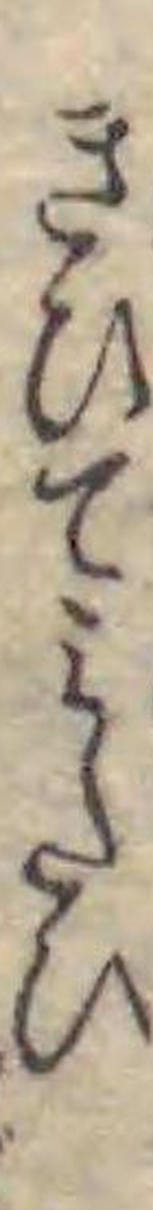きひてみたひ
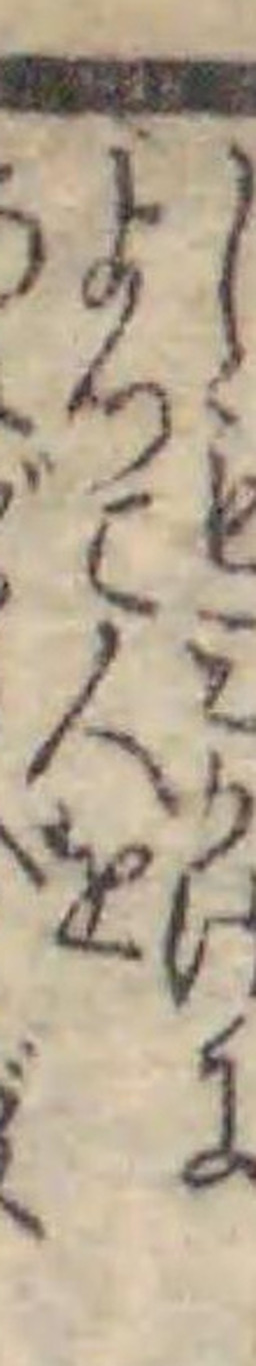よつて人を
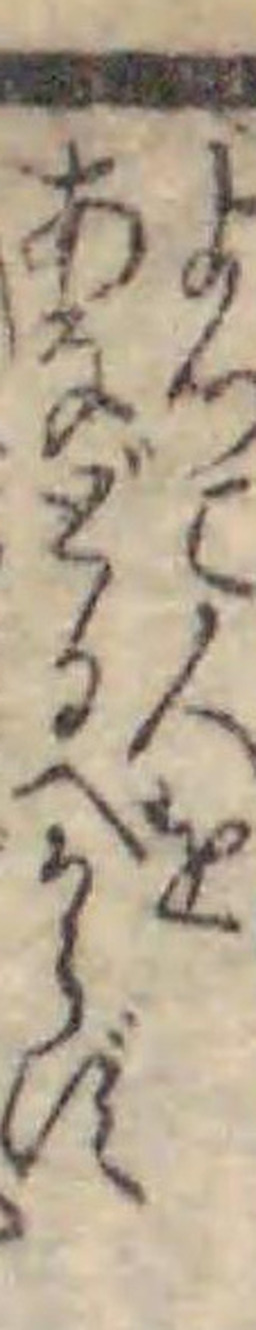あなどるへからず
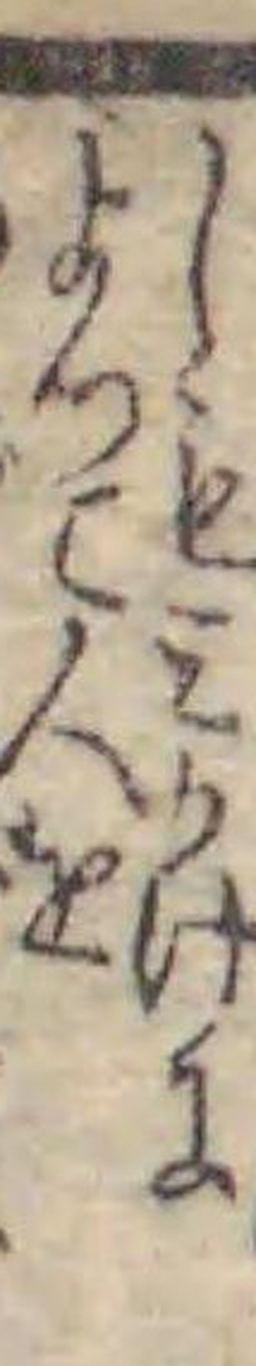よつて人を
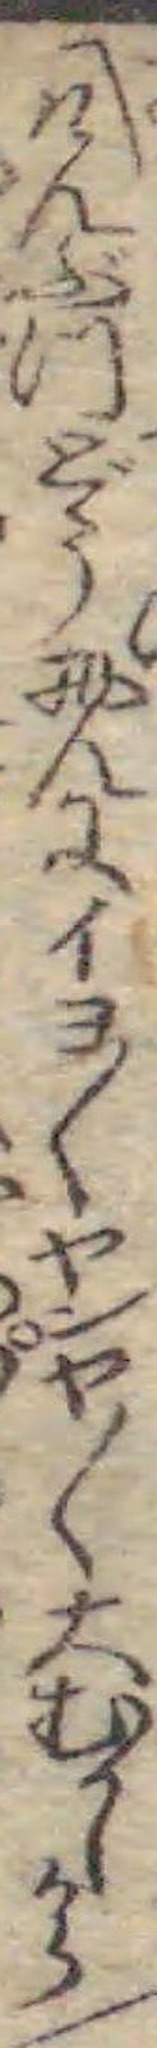〽けんぶつどうおんにイヨ〳〵ヤンヤ〳〵大むかしから
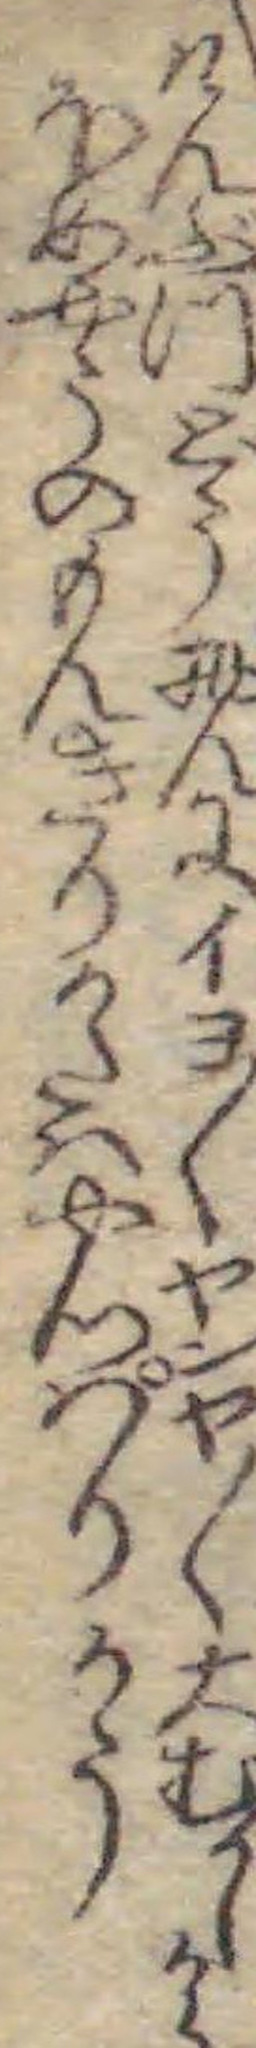ほめやうのもんきりかたはやつぱりかう

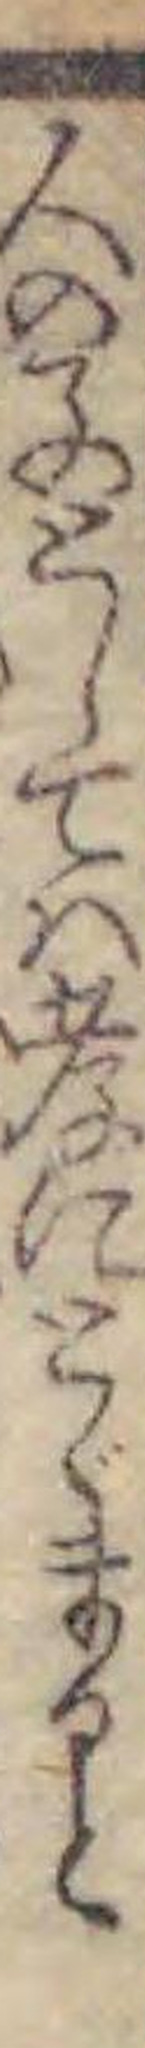人の子としては孝にとゞまると
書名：人心鏡写絵 : 3巻
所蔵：国立国会図書館 National Diet Library, JAPAN
